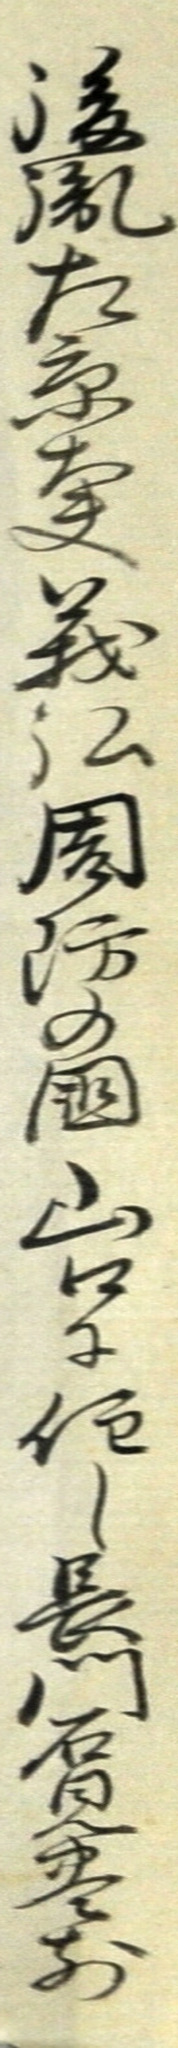後胤左京大夫義弘周防の国山口に住し長門石見豊前
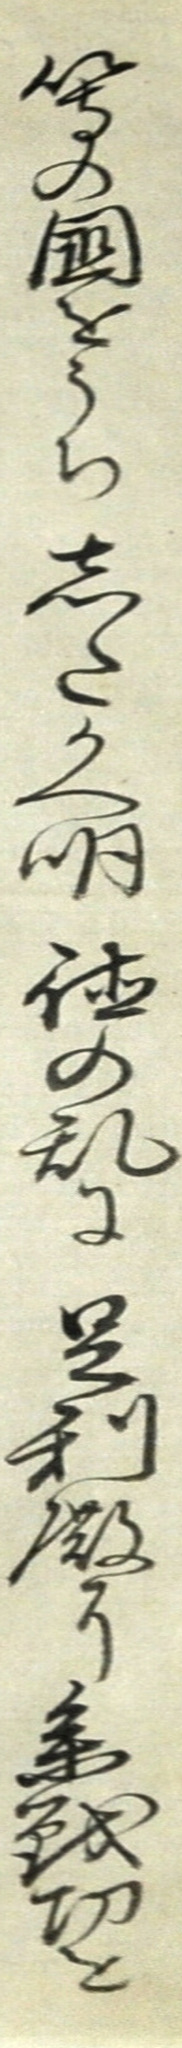等の国をうちしたかへ明徳の乱に足利殿に参戦功を
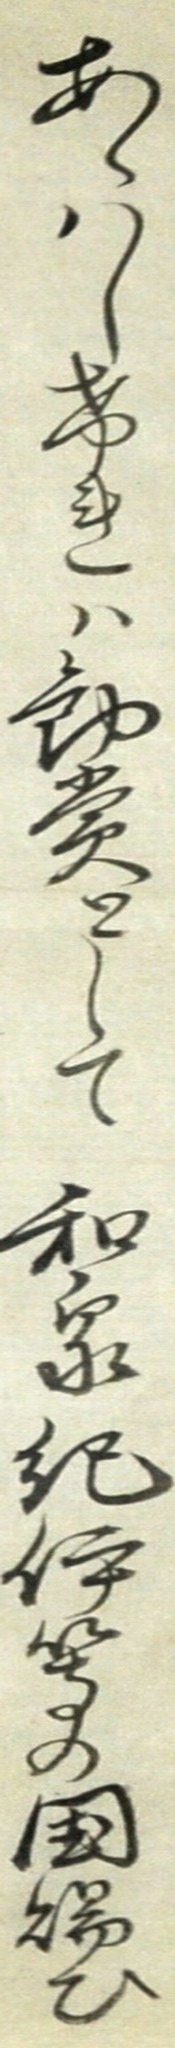あらはしけれは勧賞として和泉紀伊等の国賜ひ
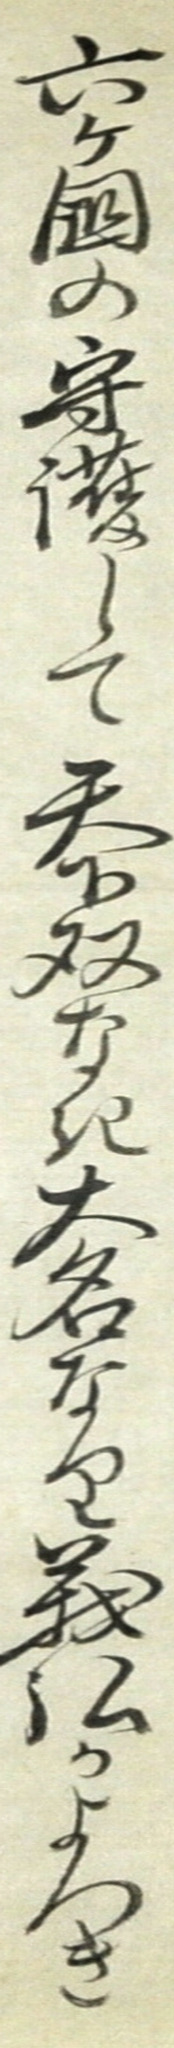六ヶ国の守護して天下双なき大名なり義弘かよつき
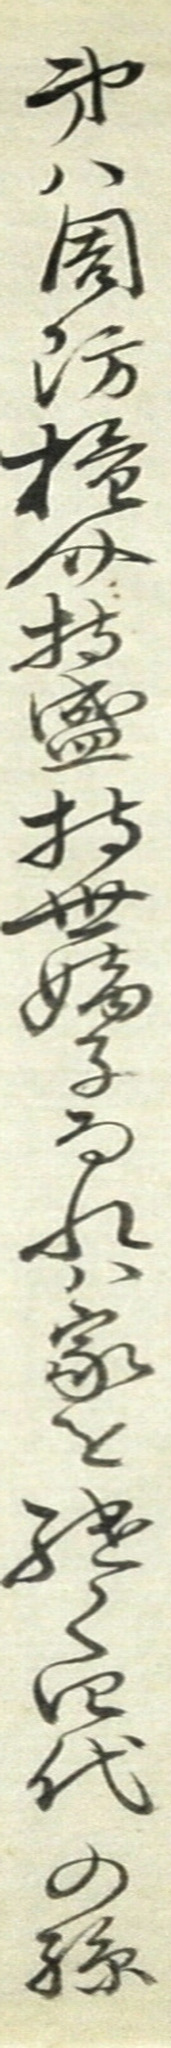弟は周防権介持盛持世嫡子なれは家を継く四代の孫
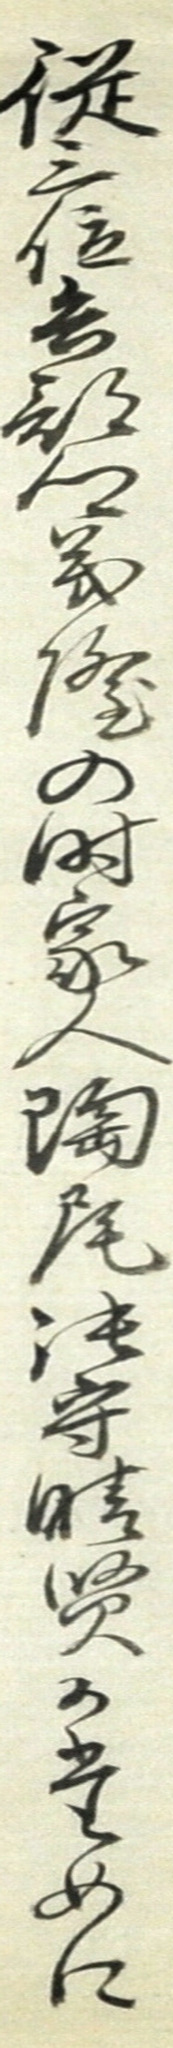従三位兵部卿義隆の時家人陶尾張守晴賢かために
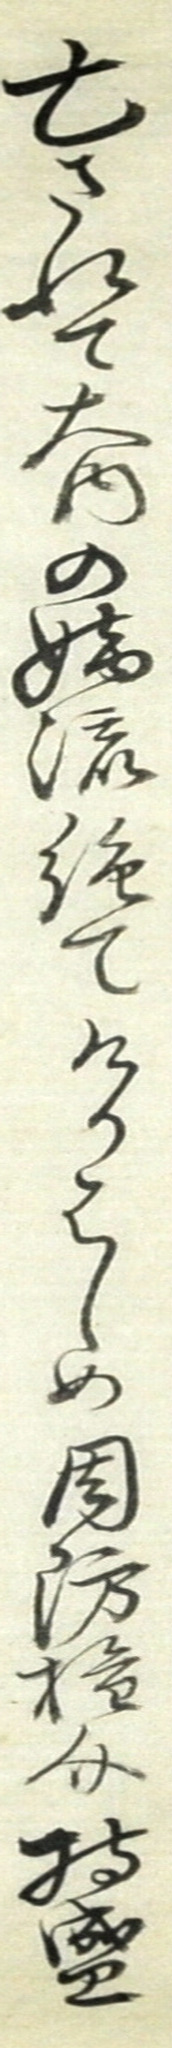亡されて大内の嫡流絶てけりはしめ周防権介持盛
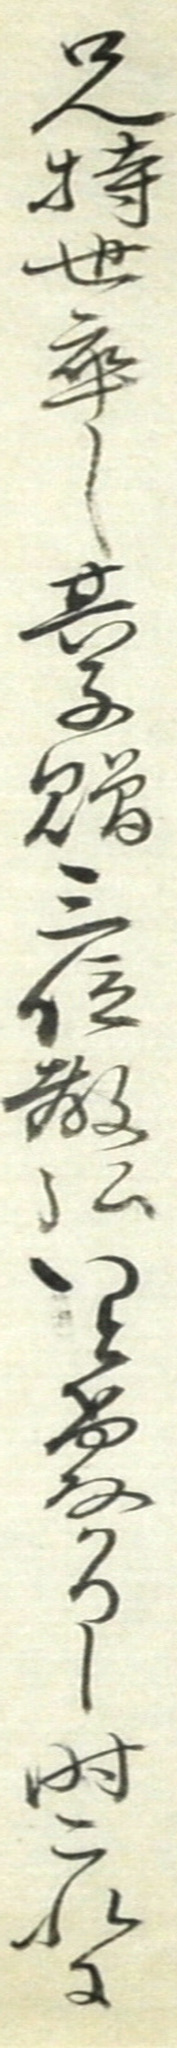兄持世卒し其子贈三位教弘いとけなかりし時これに
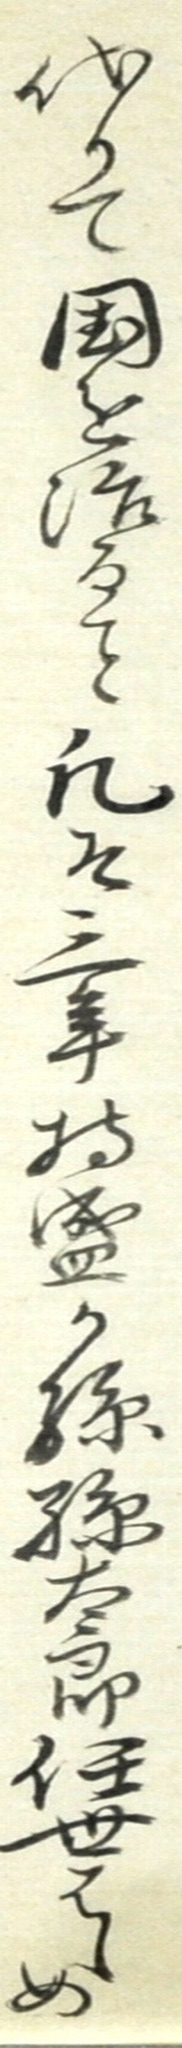代りて国を治ること凡そ三年持盛か孫孫太郎任世はしめ
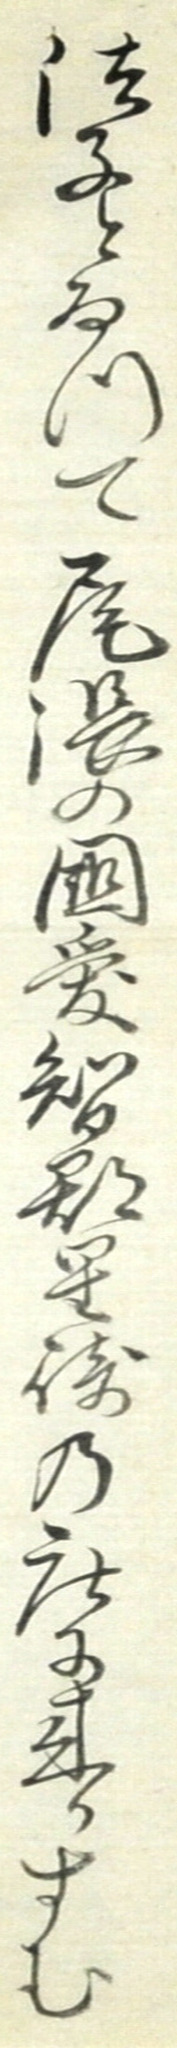法子となつて尾張の国愛智郡星崎の庄に来りすむ
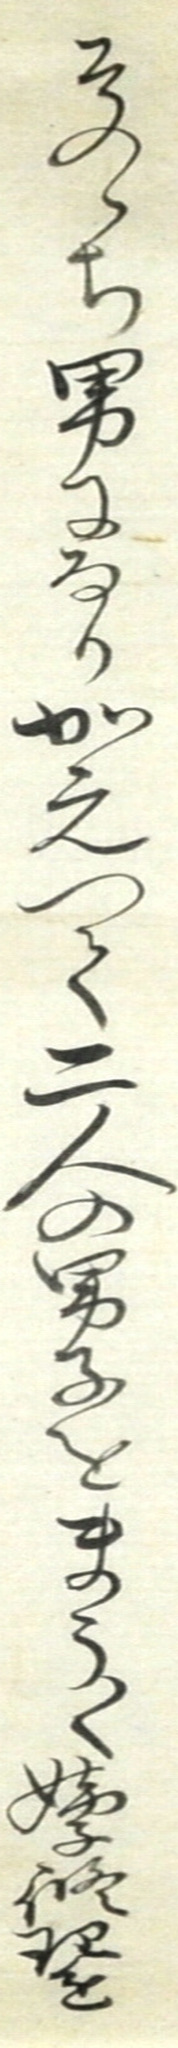そのゝち男になりかえつて二人の男子をまうく嫡子修理を
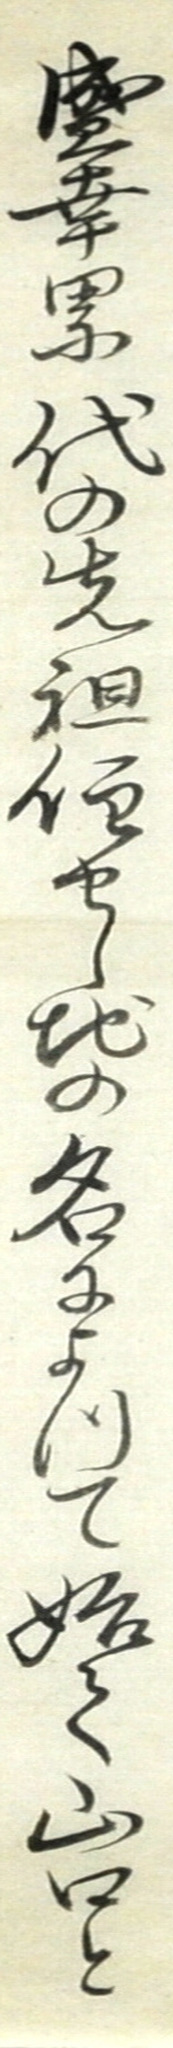盛幸累代の先祖住せし地の名によつて始て山口と
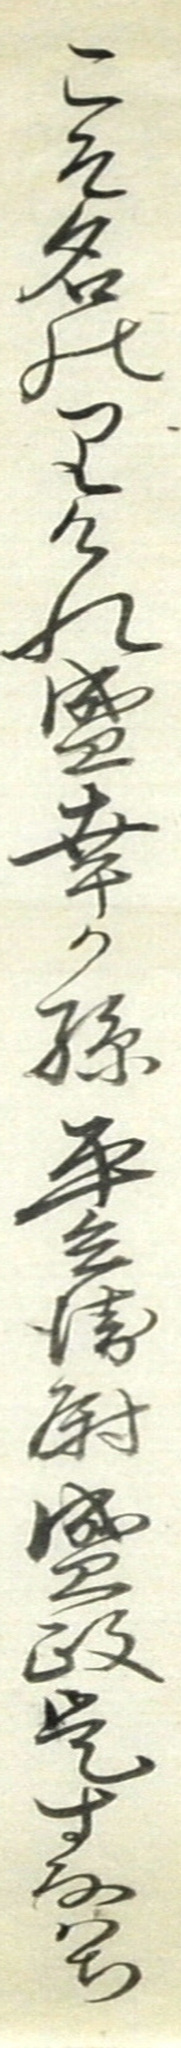こそ名のりけれ盛幸か孫平兵衛尉盛政是すなはち
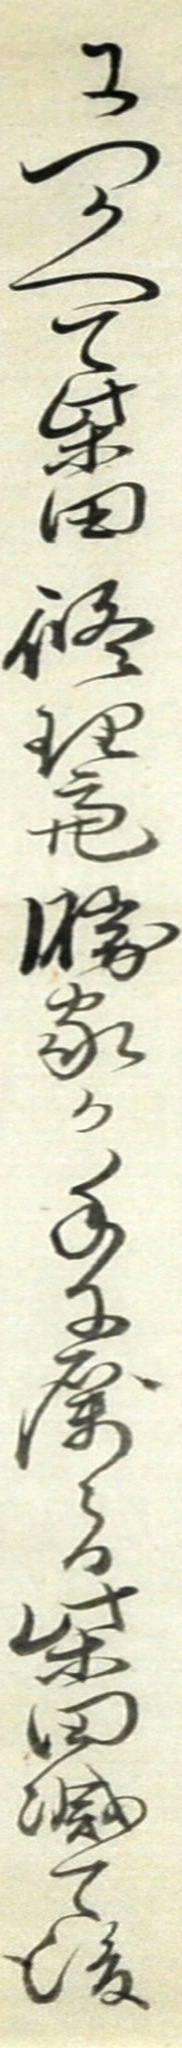につかへて柴田修理亮勝家か手に属らる柴田滅て後
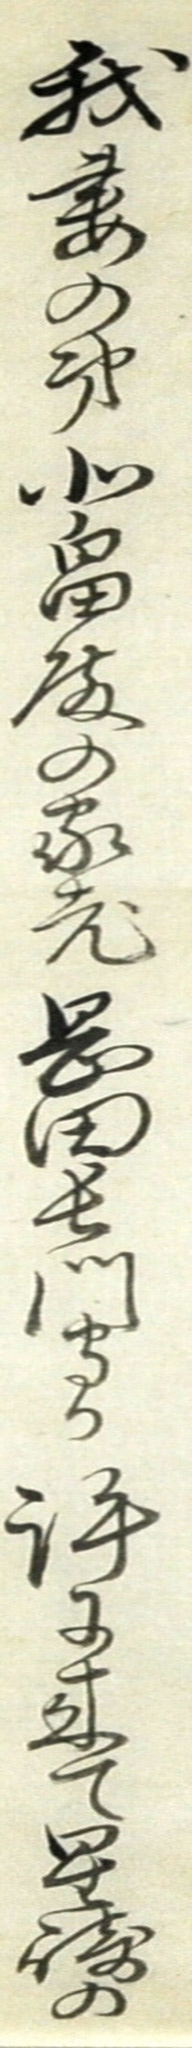我妻の弟北畠殿の家老岡田長門守か許に来て星崎の
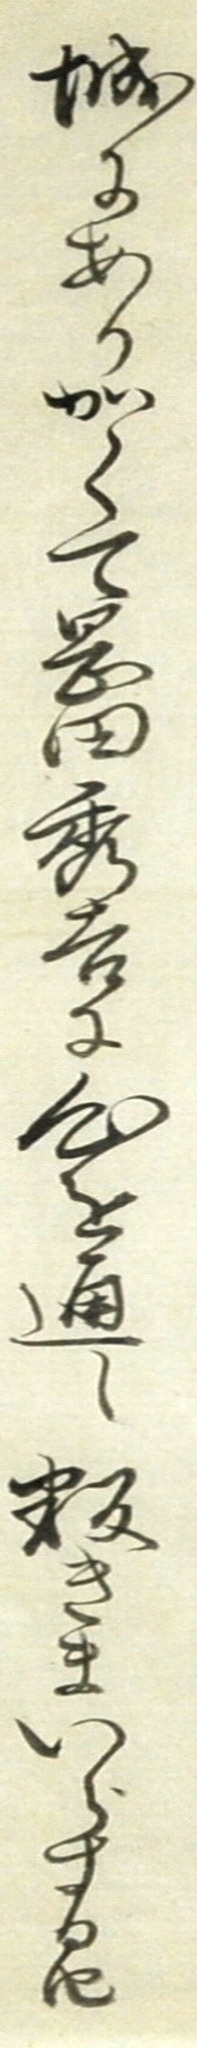城にありかくて岡田秀吉に心を通し叛きまいらする由
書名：藩翰譜（六）
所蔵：伊那市立高遠町図書館・合同会社AMANE
